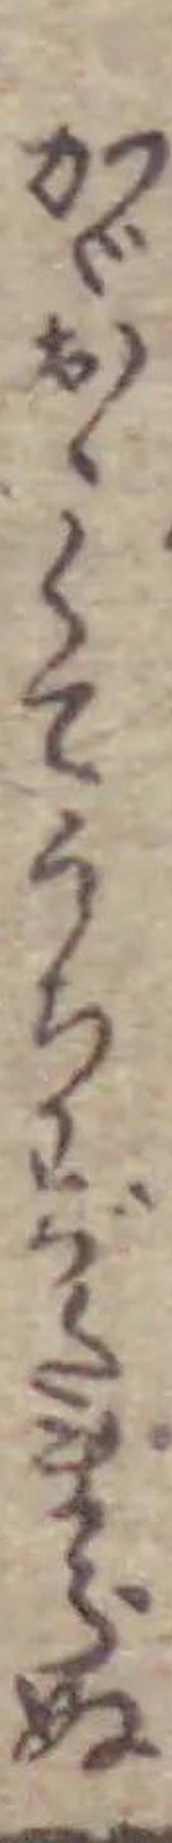かゞおゝくてうちわがたまらぬ
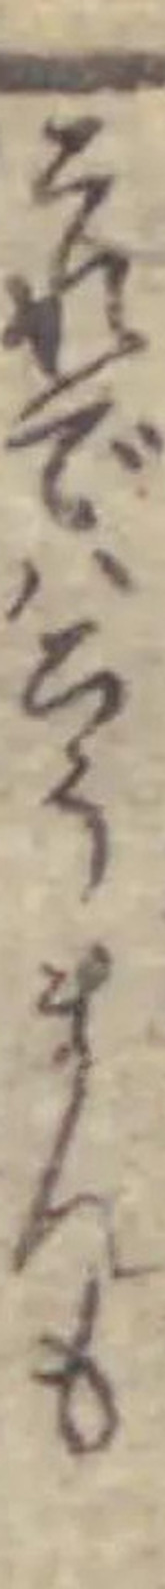これではこうまんも
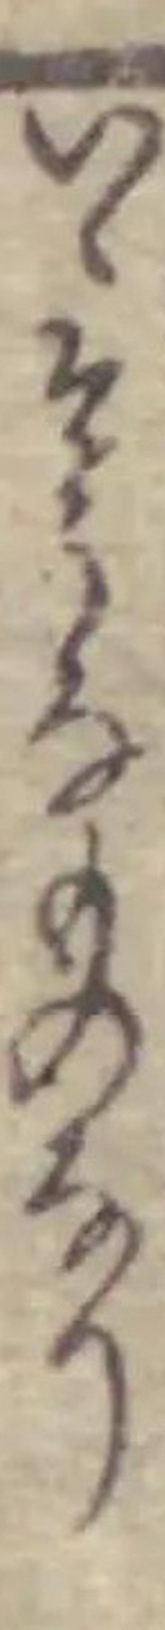いゝそうなものなり
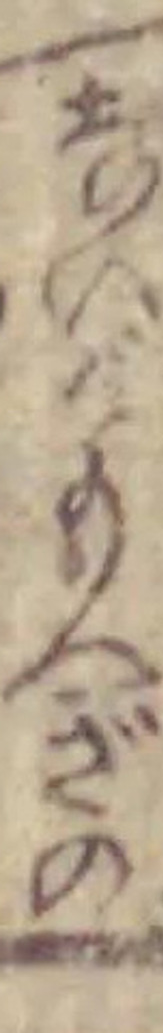ないがもへぎの
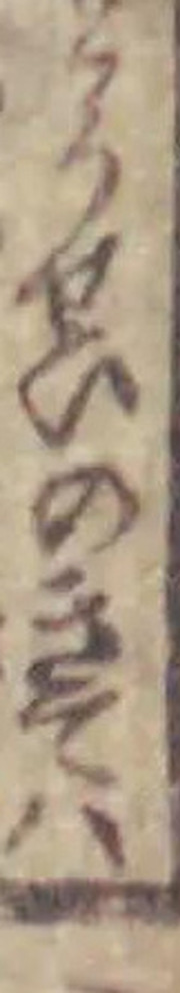とうせいのきては
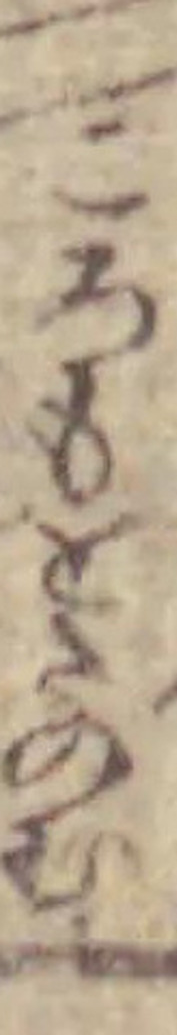ころもをたのむ
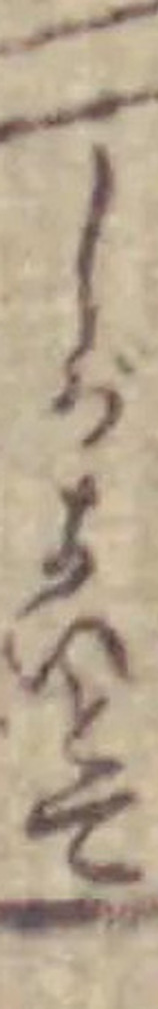しがまいとて
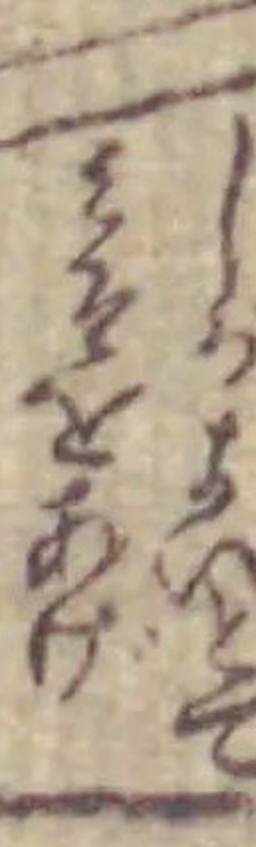みそをあげ
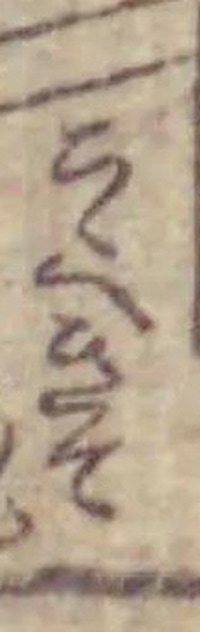こゝへきても
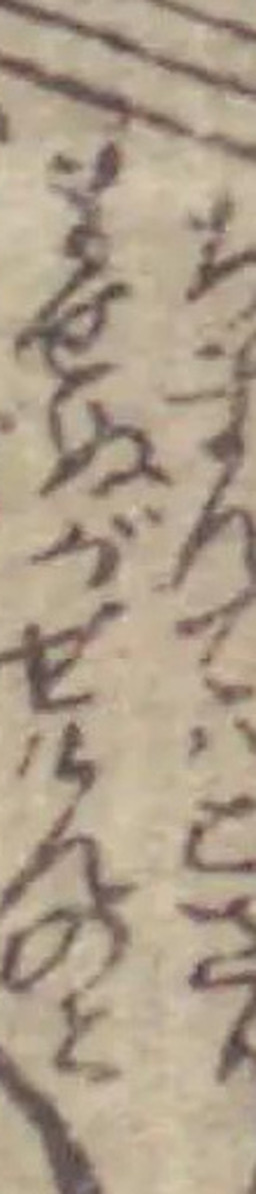ませぬがせけんのと
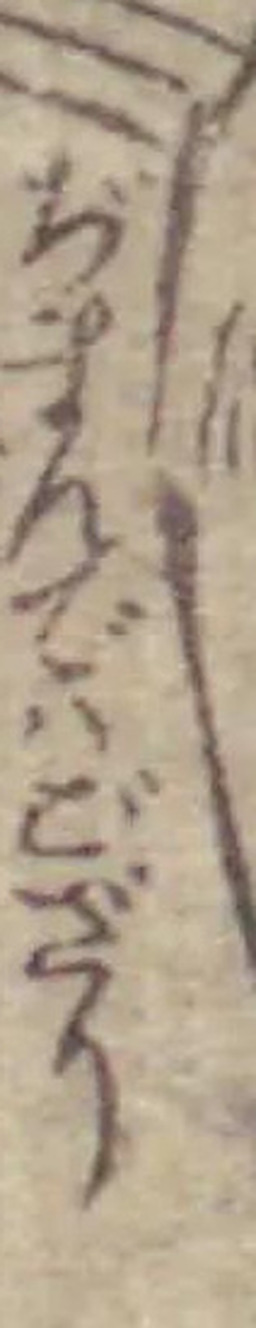ぢまんではござり
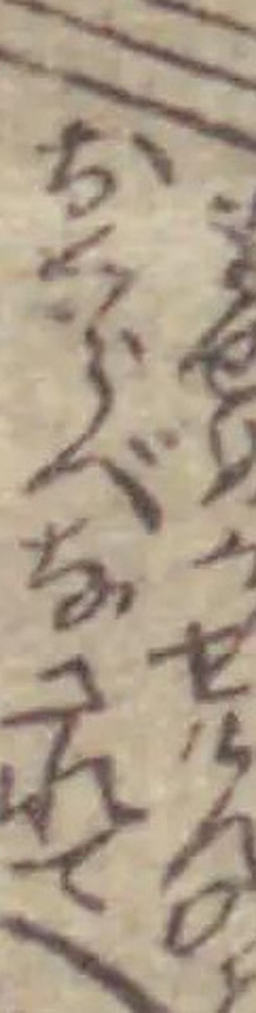おくらべなされて
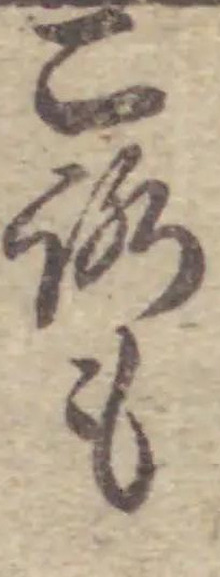ころも
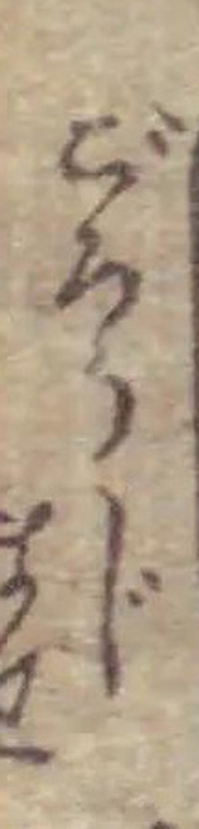ごろうじ

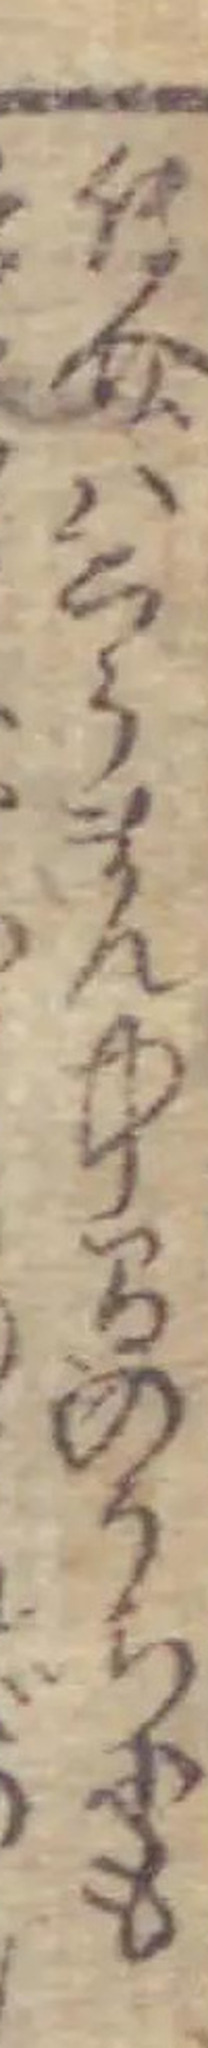伝介はこうまん中間のうちにも
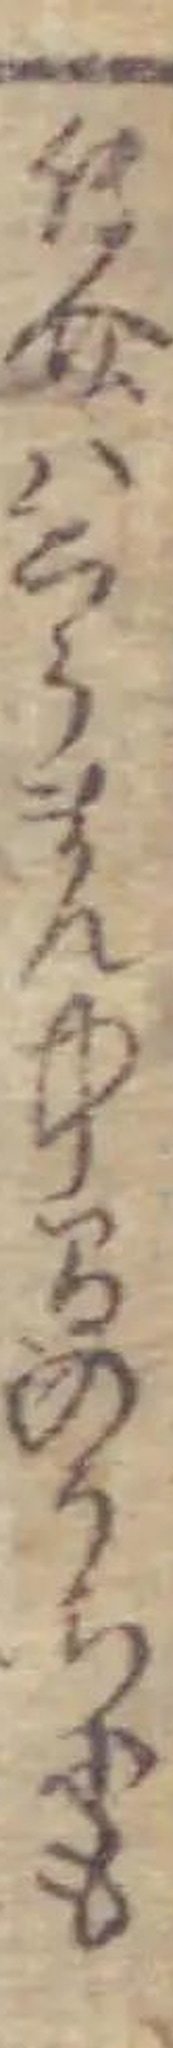伝介はこうまん中間のうちにも
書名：珍説女天狗 2巻
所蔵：国立国会図書館 National Diet Library, JAPAN
